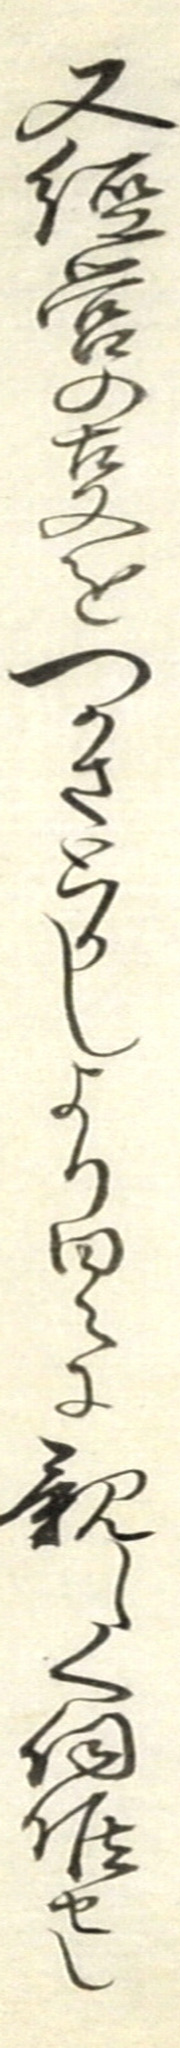又経営の事をつかさとりしより日々に親しく伺候せし
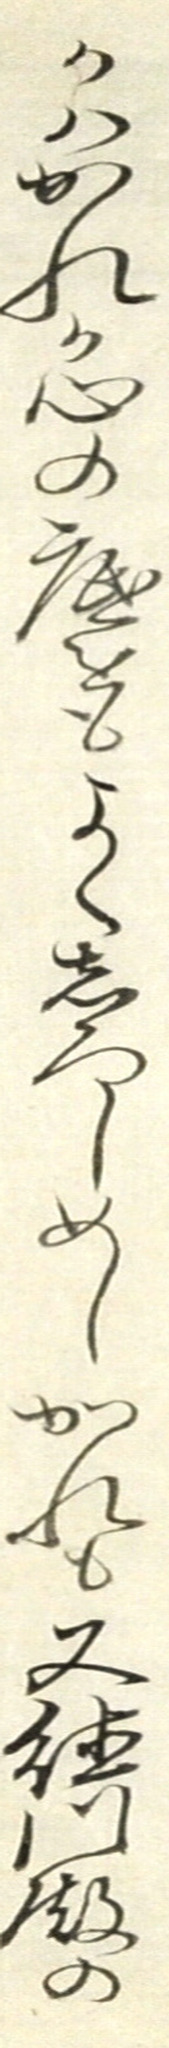かはかれか心の底をもよくしろしめしかれも又徳川殿の
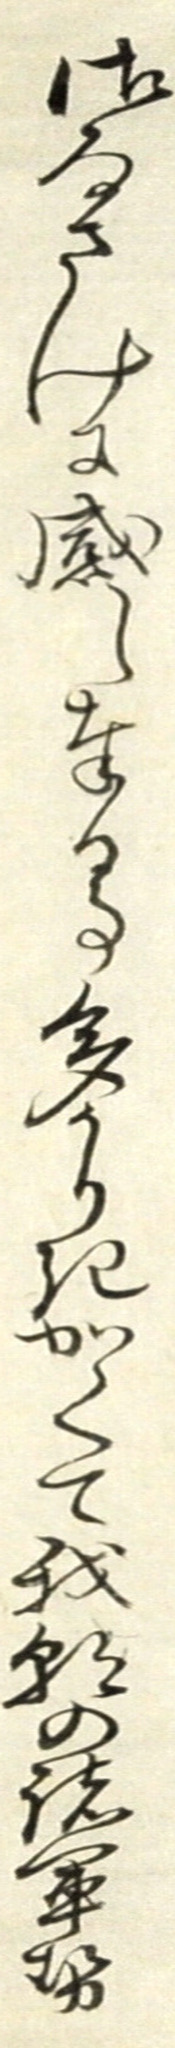御なさけに感し奉る事多かりきかくて我朝の諸軍勢
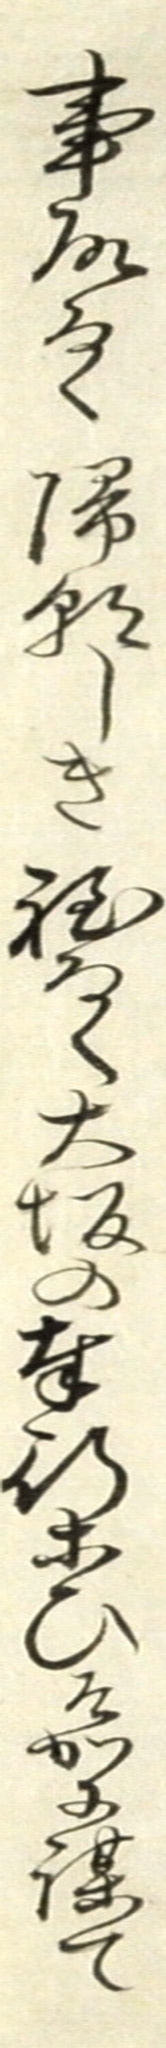事故なく帰朝しき程なく大坂の奉行等ひそかに謀て
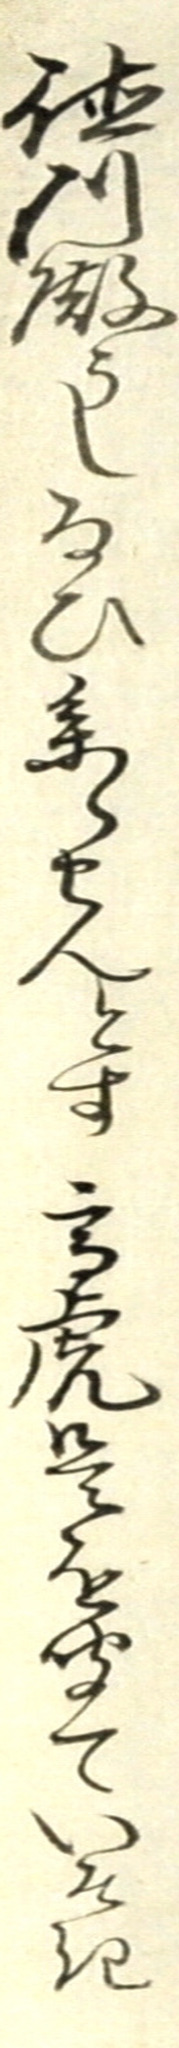徳川殿うしなひ参らせんとす高虎是を聞ていそき

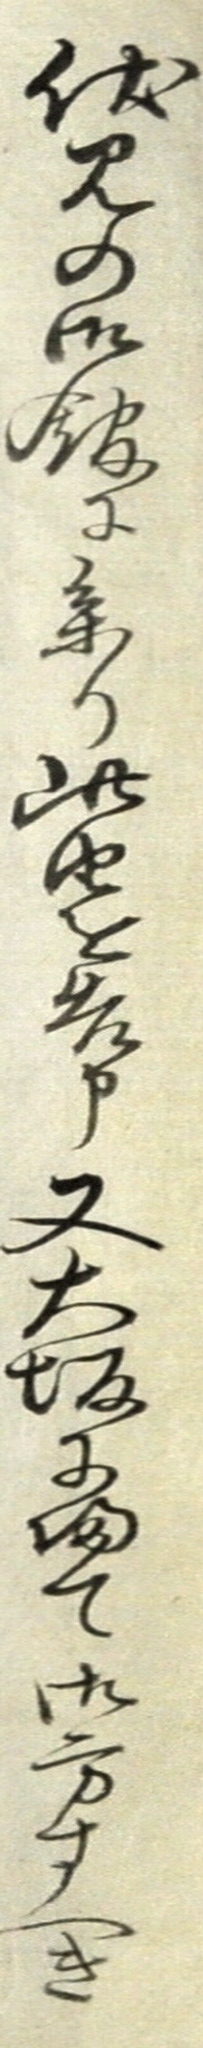伏見の御館に参り此由を告申又大坂に帰て御方すへき
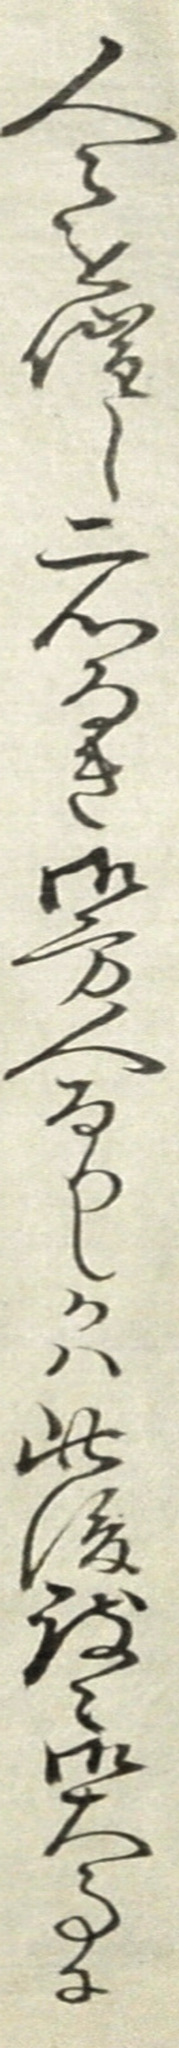人々を催し二心なき御方人なりしかは此後度々御大事に
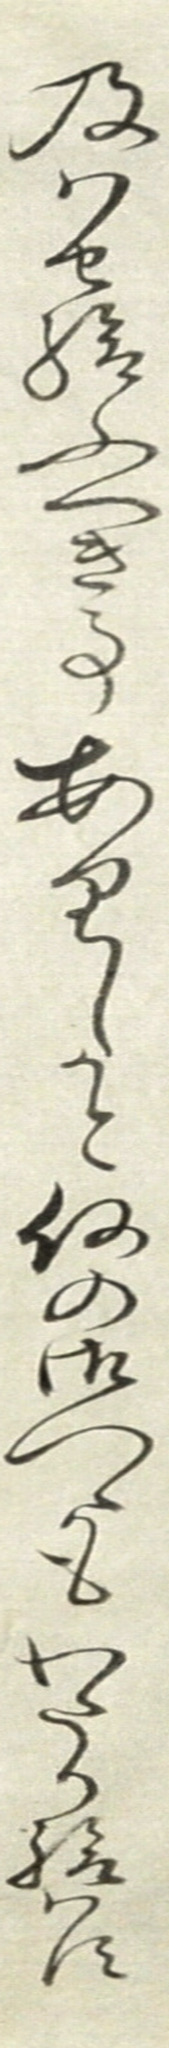及はせ給ふへき事ありしかと何の御つゝかもわたり給はす
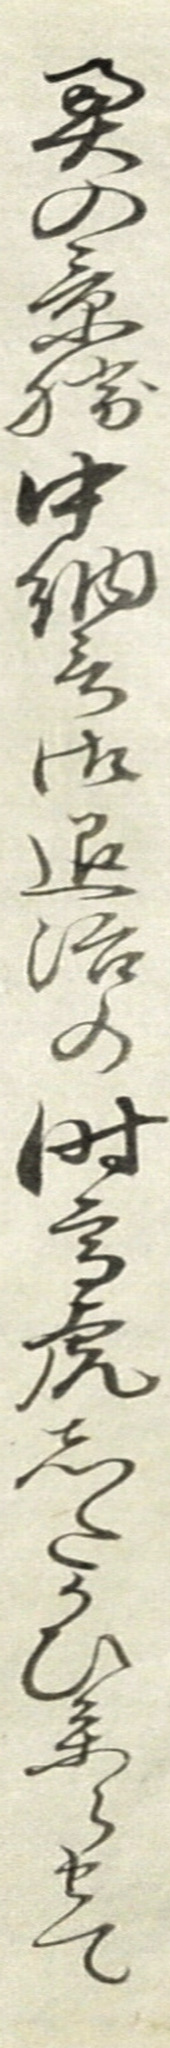奥の景勝中納言御退治の時高虎したかひ参らせて
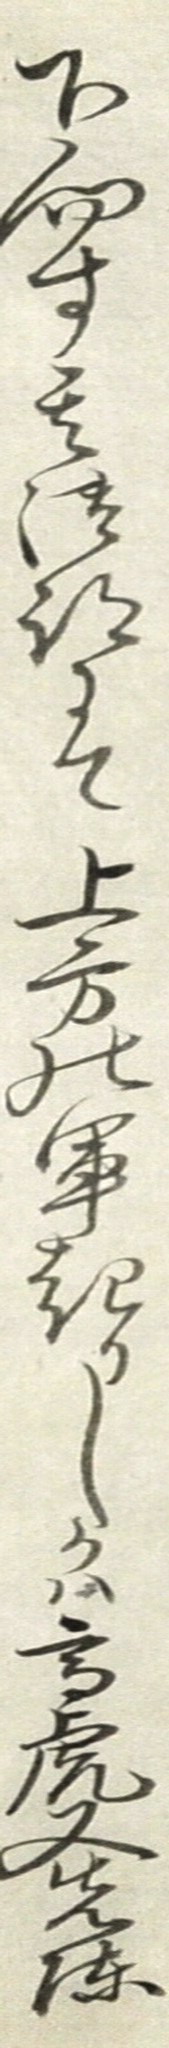下向す其御跡にて上方の軍起りしかは高虎又先陣
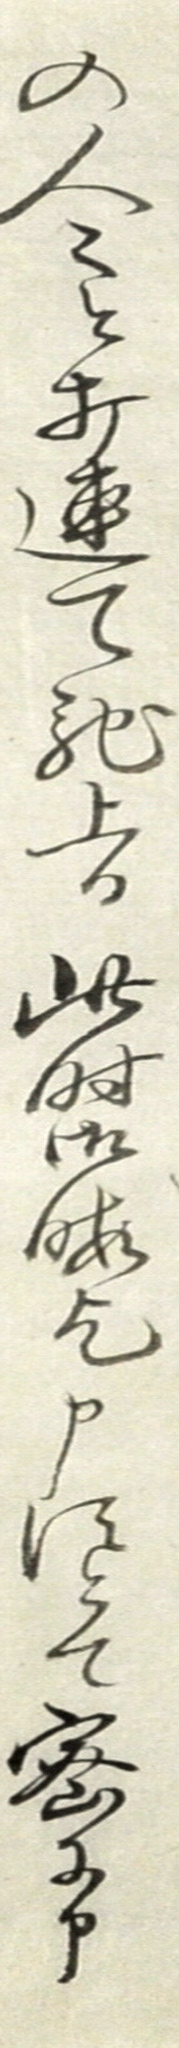の人々と打連て馳上る此時御晦乞申すとて密に申
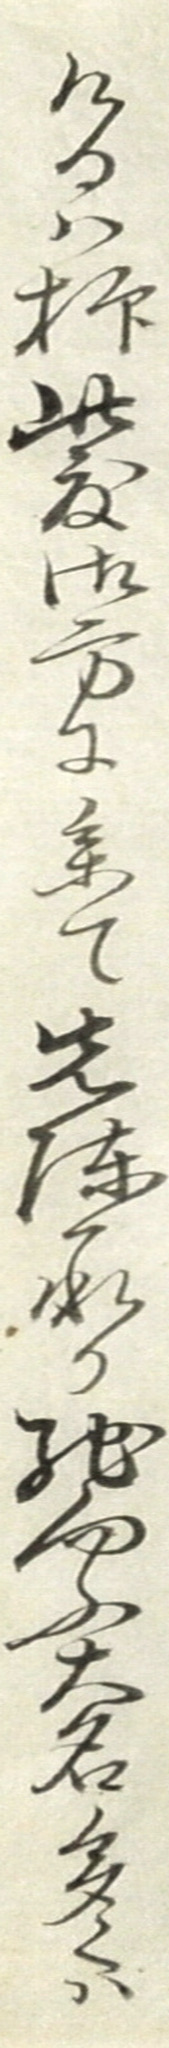けるは抑此度御方に参て先陣承り馳向ふ大名多くは
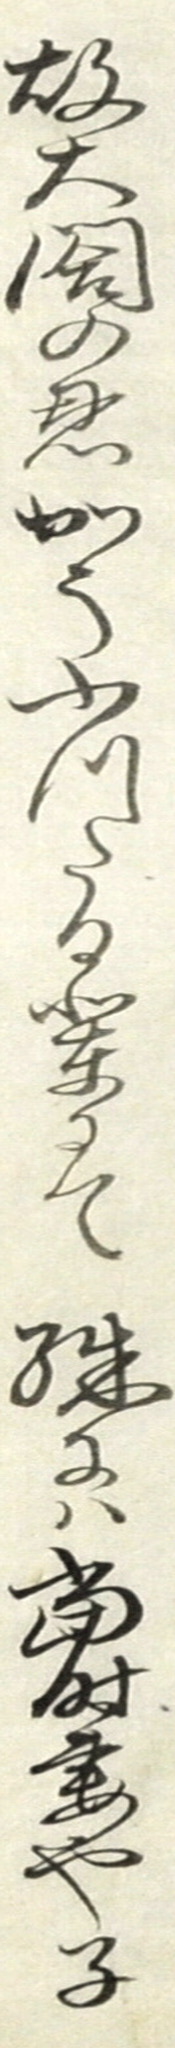故大閤の恩かうふつたる輩にて殊には当時妻や子
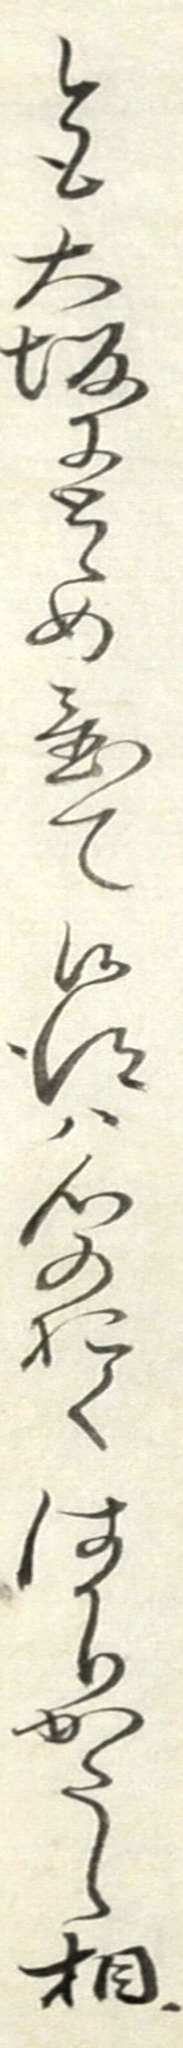とも大坂にとゝめ置て候得は心のおくはかりかたし相
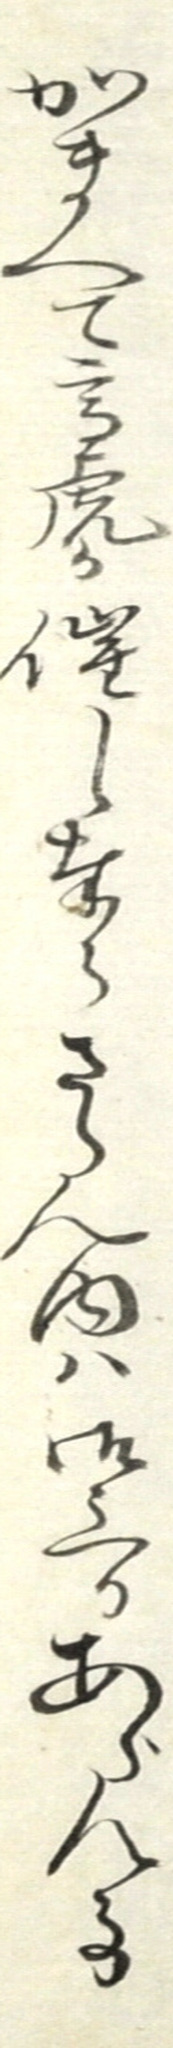かまへて高虎か催し奉らさらん内は御上りあらん事
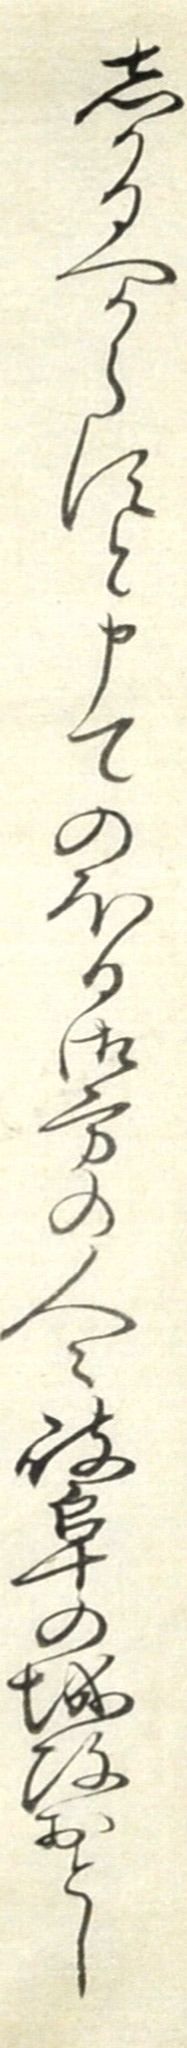しかるへからすと申てのほる御方の人々岐阜の城攻おとし
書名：藩翰譜（七・下）
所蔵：伊那市立高遠町図書館・合同会社AMANE
